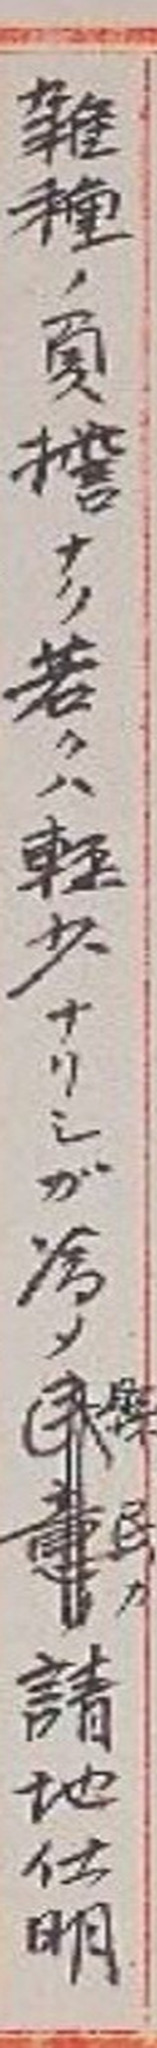雑種ノ負担ナク若クハ軽少ナリシガ為メ県民カ請地仕明
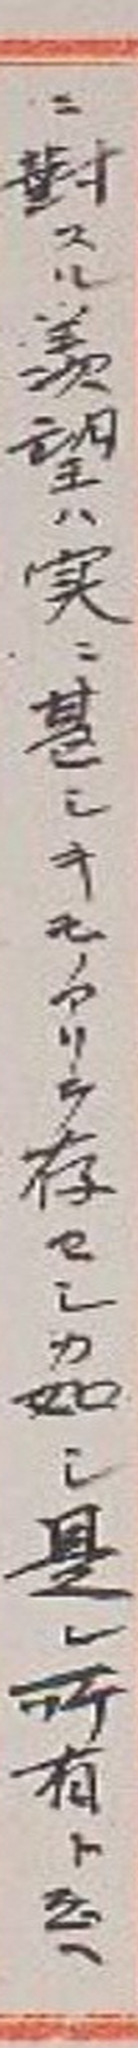ニ対スル羨望ハ実ニ甚シキモノアリテ存セシカ如シ是レ所有ト云ヘ
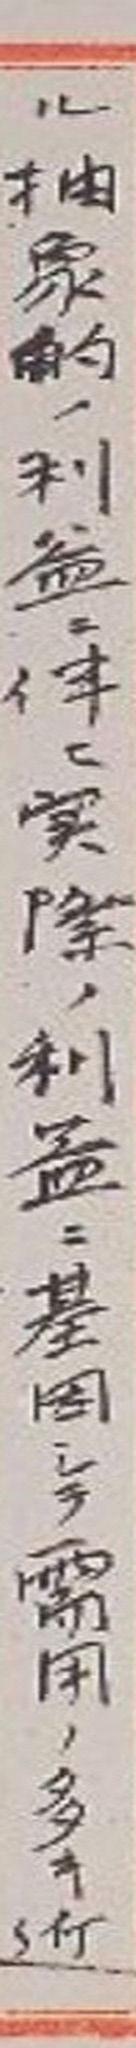ル抽象的ノ利益ニ伴ヒ実際ノ利益ニ基因シテ需用ノ多キ近
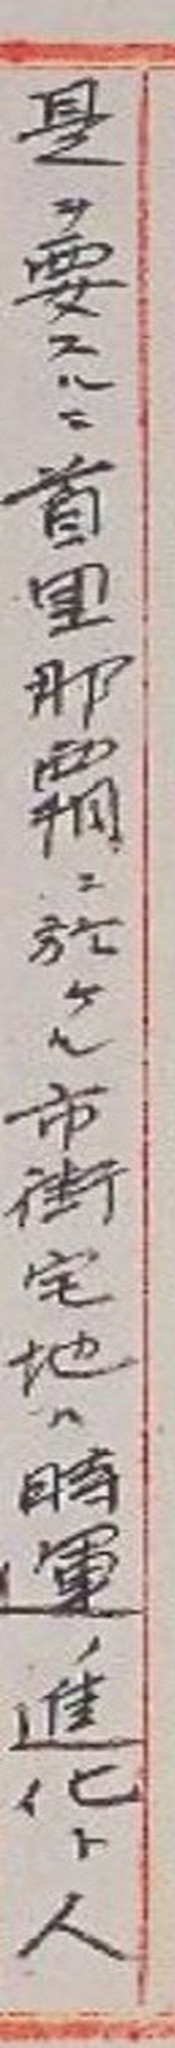是ヲ要スルニ首里那覇ニ於ケル市街宅地ハ時運ノ進化ト人
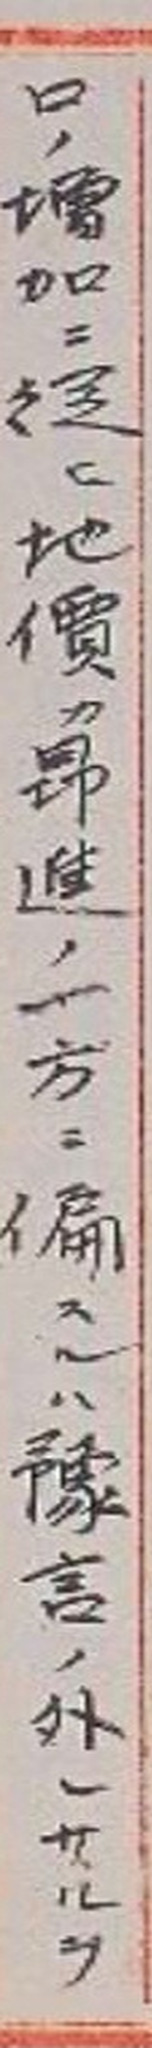口ノ増加ニ従ヒ地価カ昂進ノ一方ニ偏スルハ予言ノ外レサルヲ
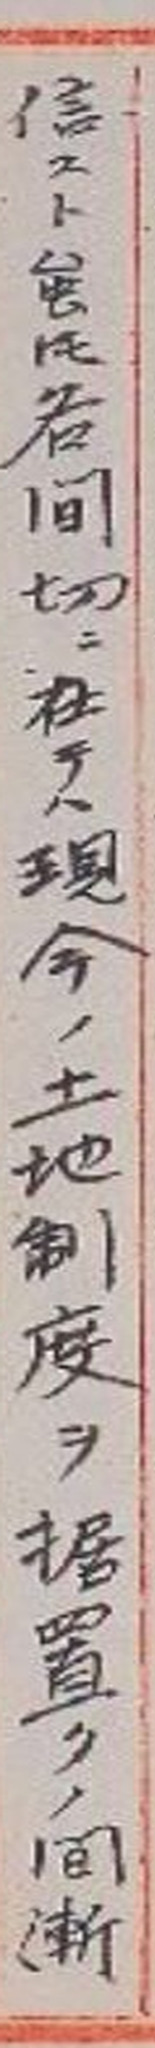信スト雖トモ各間切ニ在テハ現今ノ土地制度ヲ据置クノ間漸

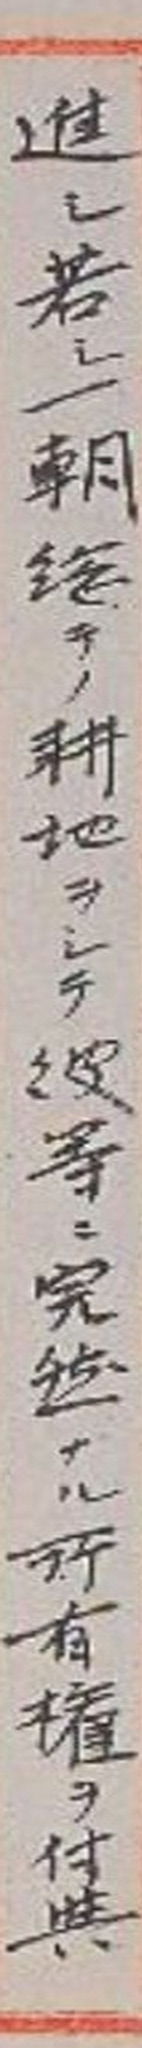進シ若シ一朝総テノ耕地ヲシテ彼等ニ完然ナル所有権ヲ付与
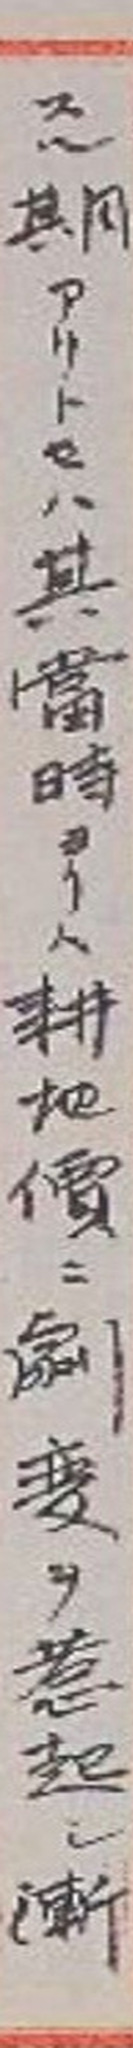スル期アリトセハ其当時ヨリハ耕地価ニ劇変ヲ惹起シ漸
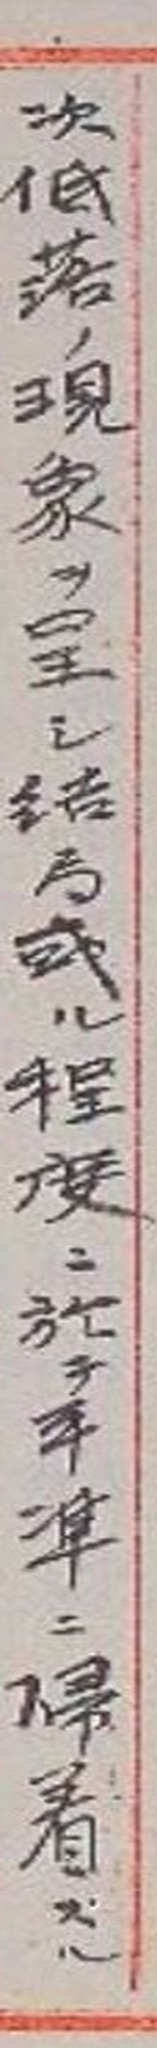次低落ノ現象ヲ呈シ結局或ル程度ニ於テ平準ニ帰着スル
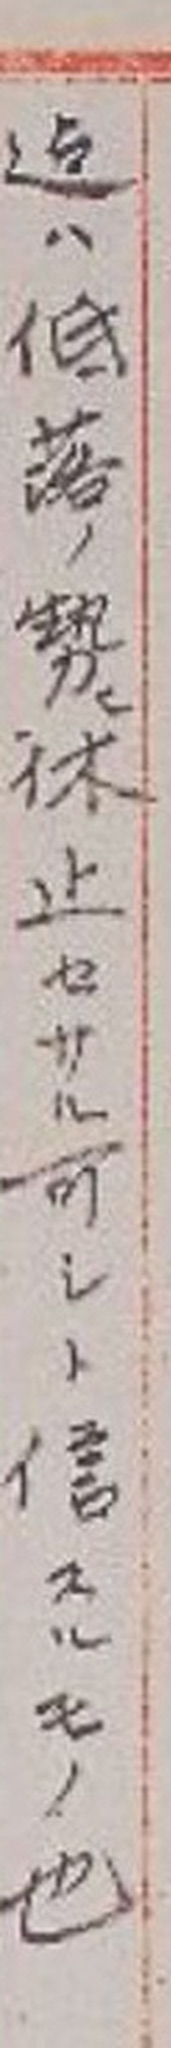迄ハ低落ノ勢ヒ休止セサル可シト信スルモノ也

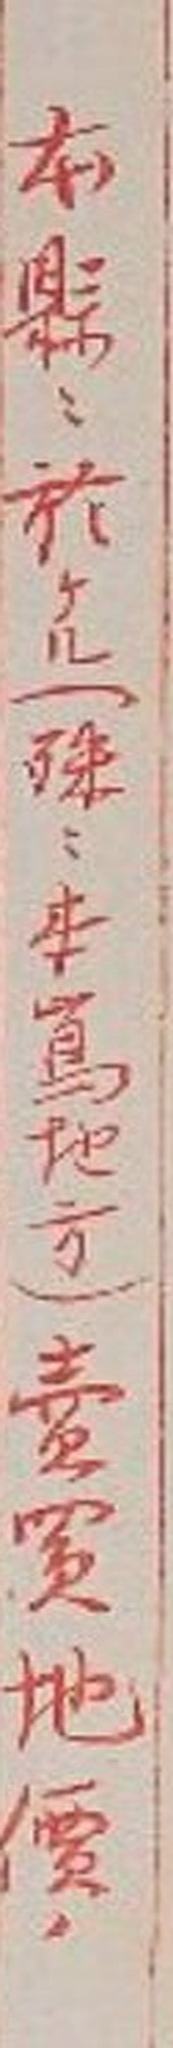本県ニ於ケル(殊ニ本島地方)売買地価ノ
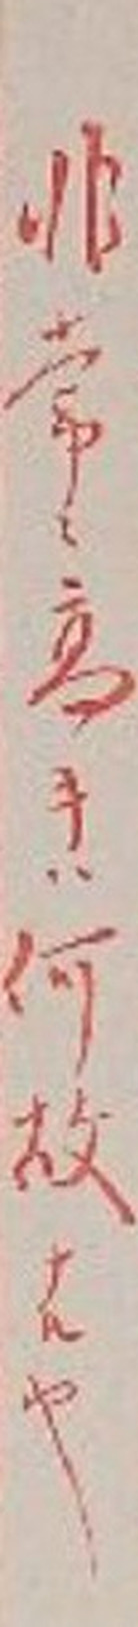非常ニ高キハ何故ナルヤ
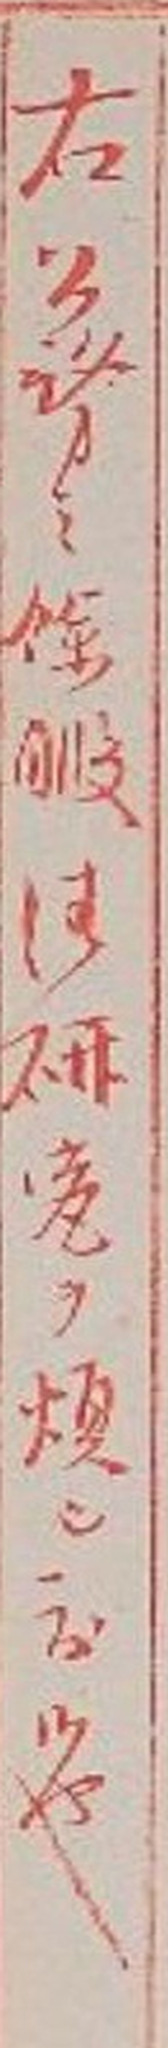右公務之余暇御研究ヲ煩シ度候也
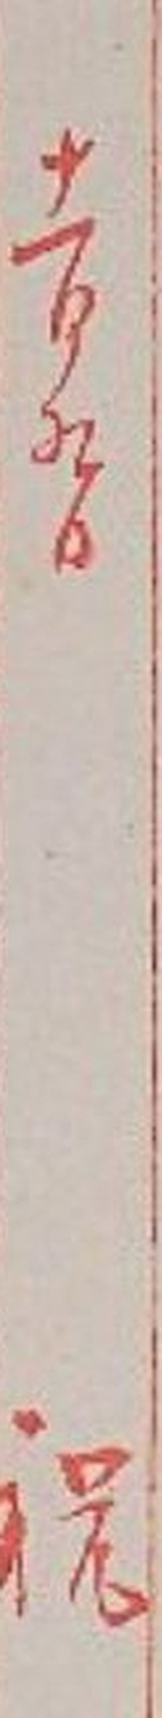十一月九日祝

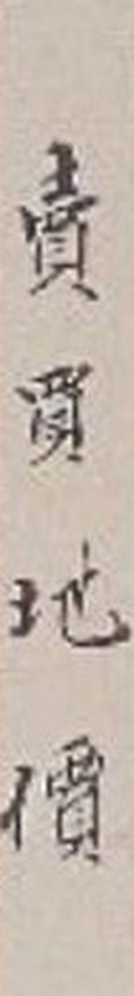売買地価
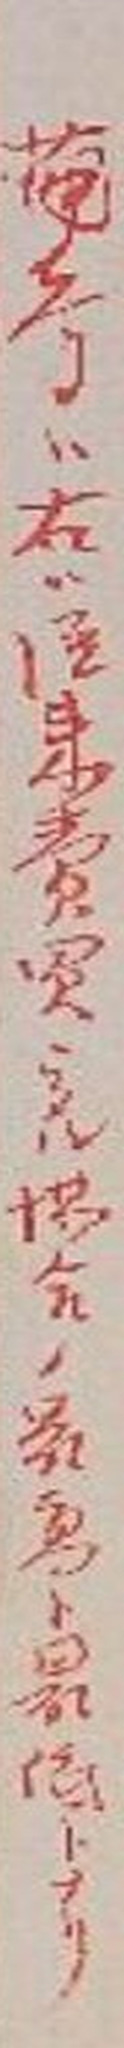ハ右ハ従来売買シタル場合ノ最高ト最低トナリ
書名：本県地価ノ高キ理由調書
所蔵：University of the Ryukyus Library
